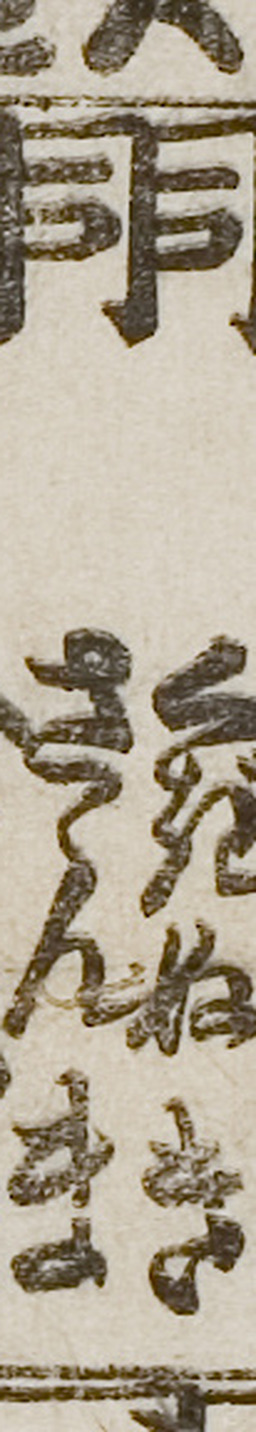同さんま
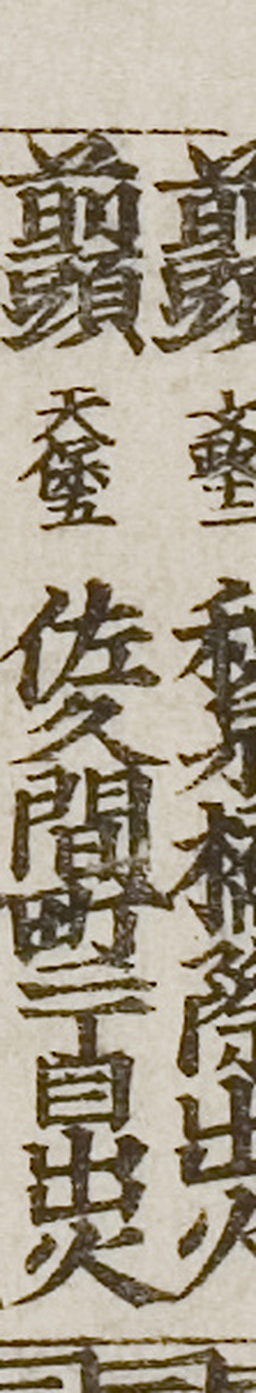前頭天保五佐久間町二丁目出火
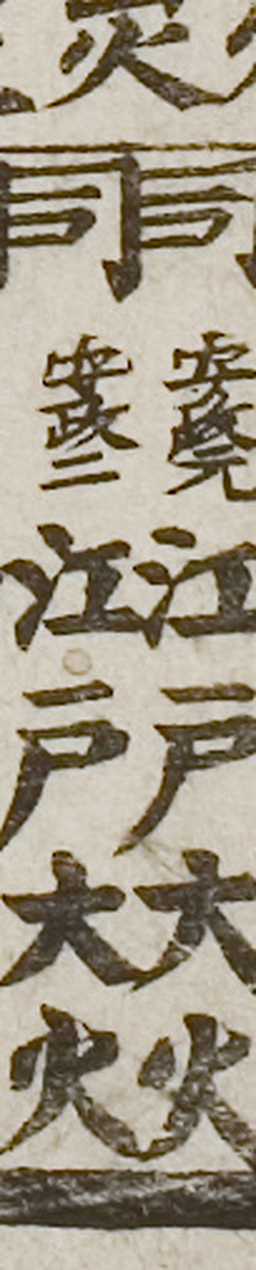同安政二江戸大火
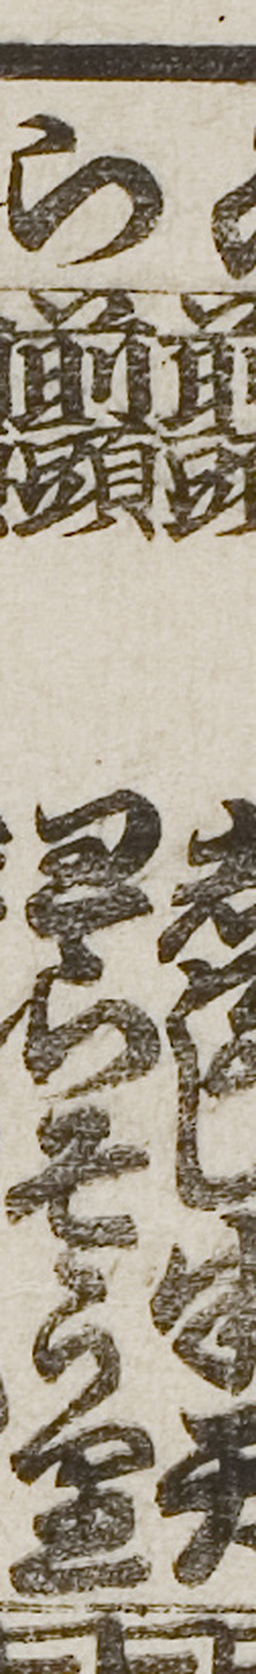前頭わらそうり
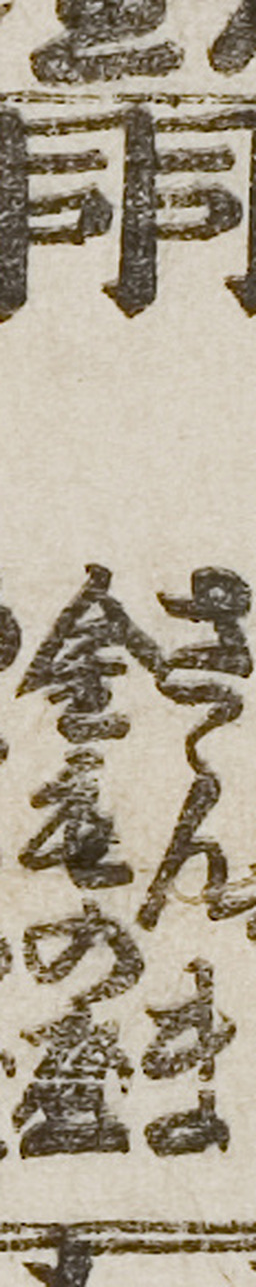同金もの屋
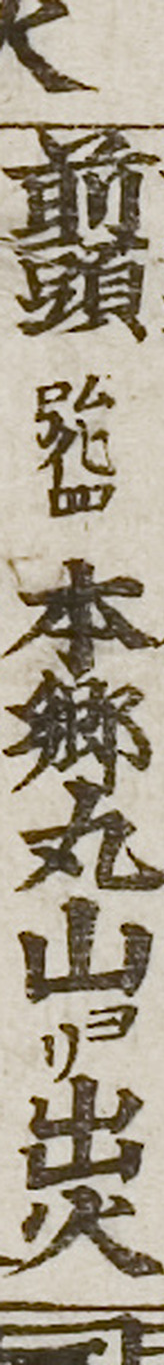前頭弘化四本郷丸山ヨリ出火
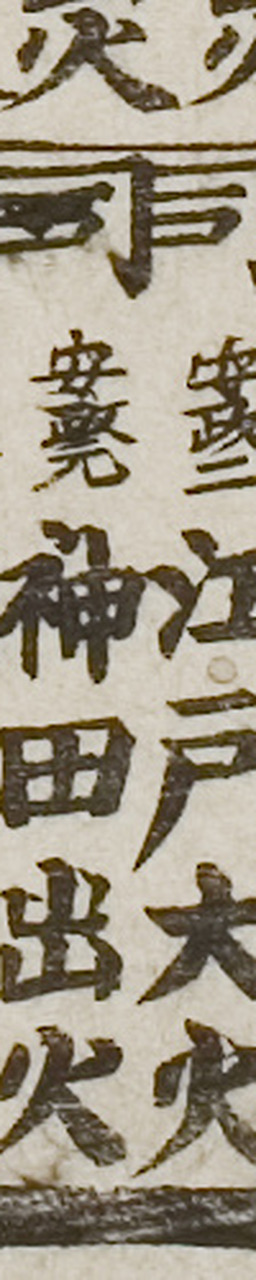同安政元神田出火
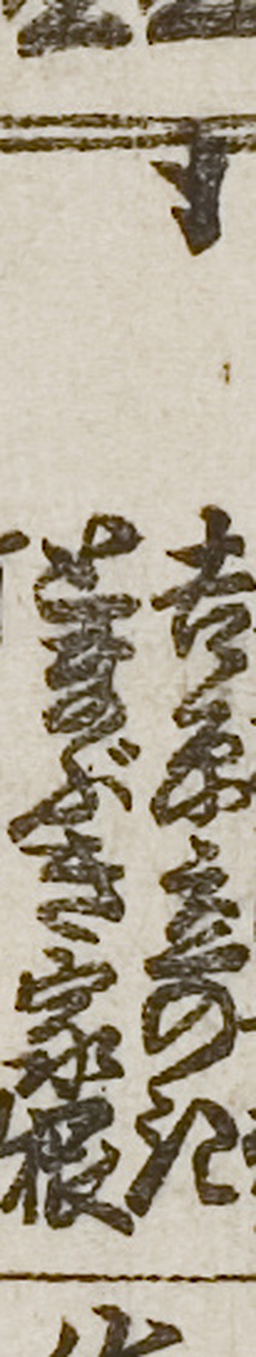同とまぶき家根
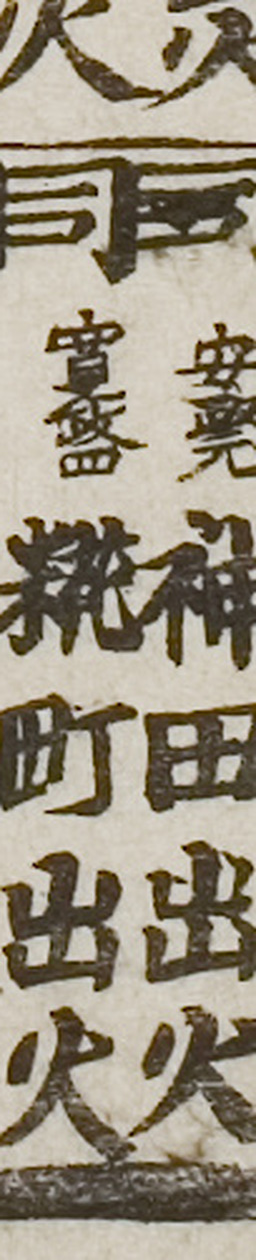同寛政四糀町出火
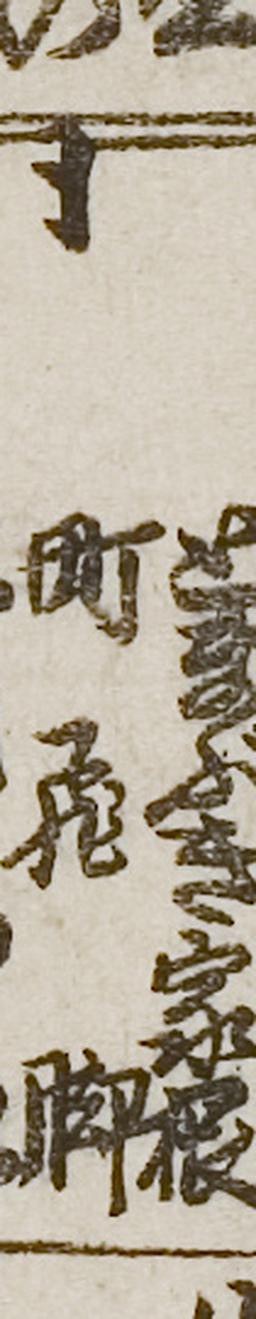同町飛脚
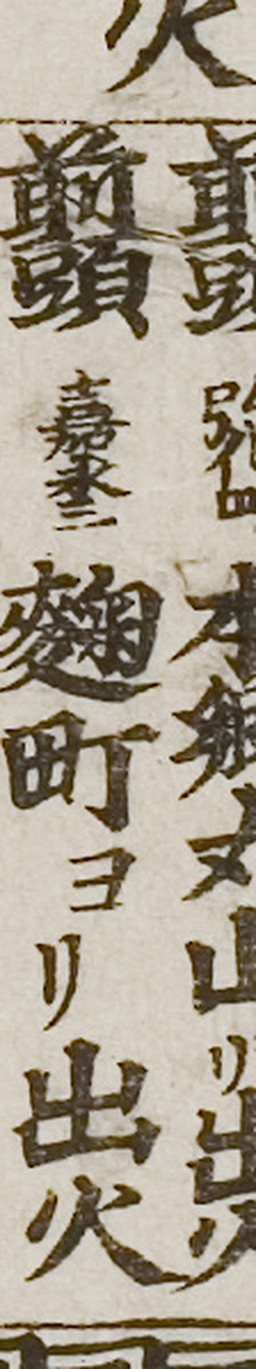前頭嘉永三麹町ヨリ出火
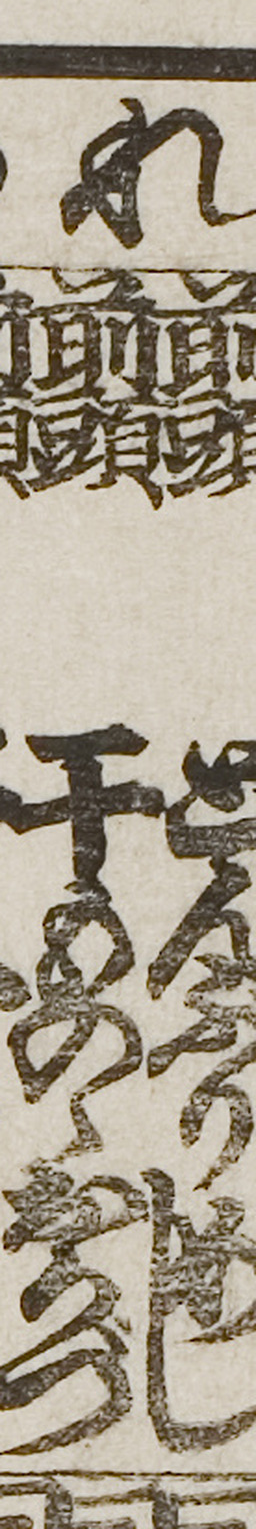前頭干ものゝおかづ
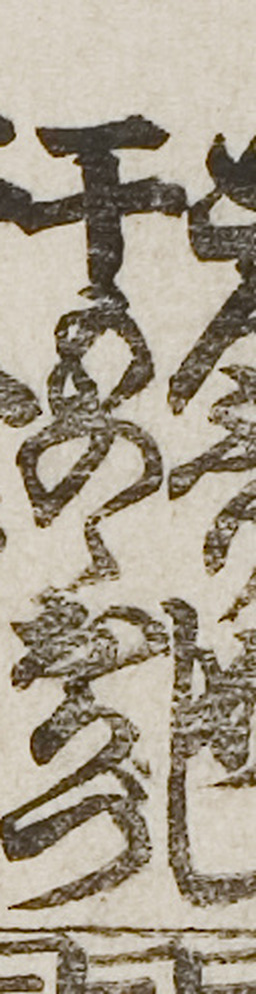前頭干ものゝおかづ
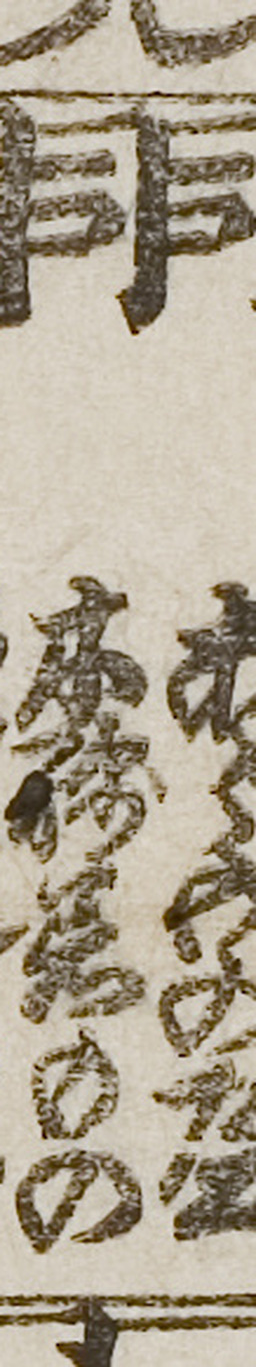同木綿着もの
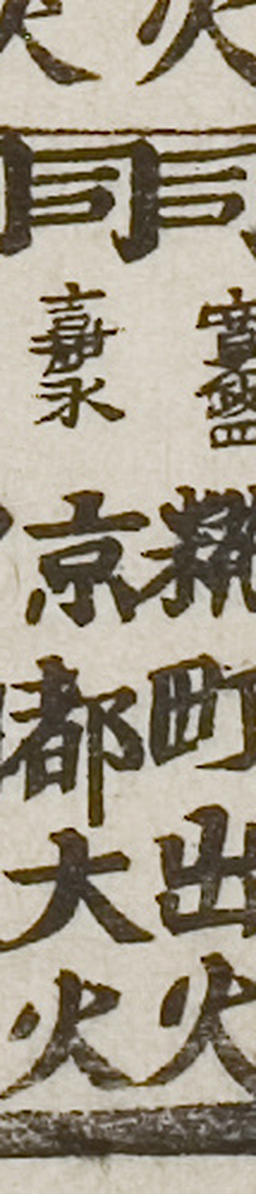同嘉永京都大火
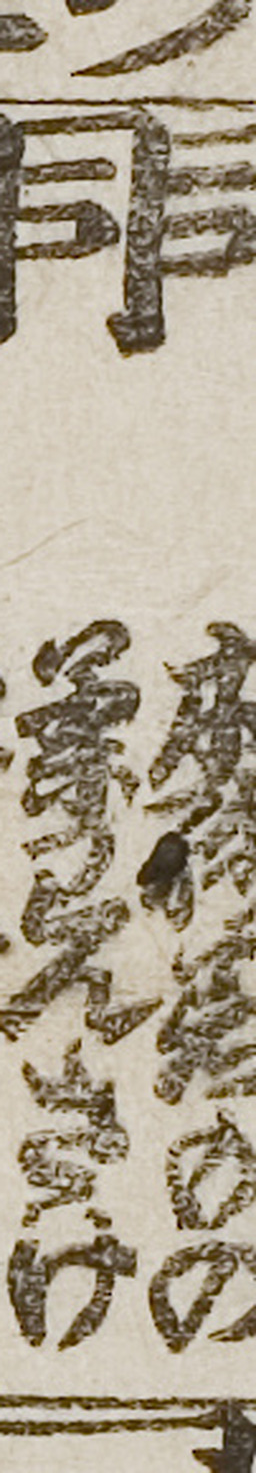同茶わんさけ
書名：世中当座帳
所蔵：東京大学総合図書館 General Library in the University of Tokyo, JAPAN
